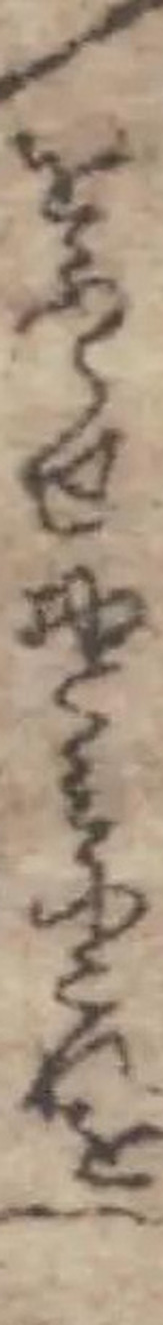をふらせおとミにこれを
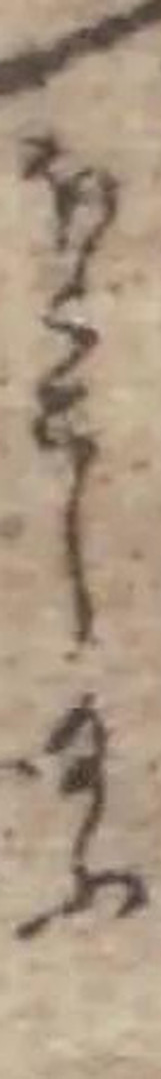ほどこし給ふ

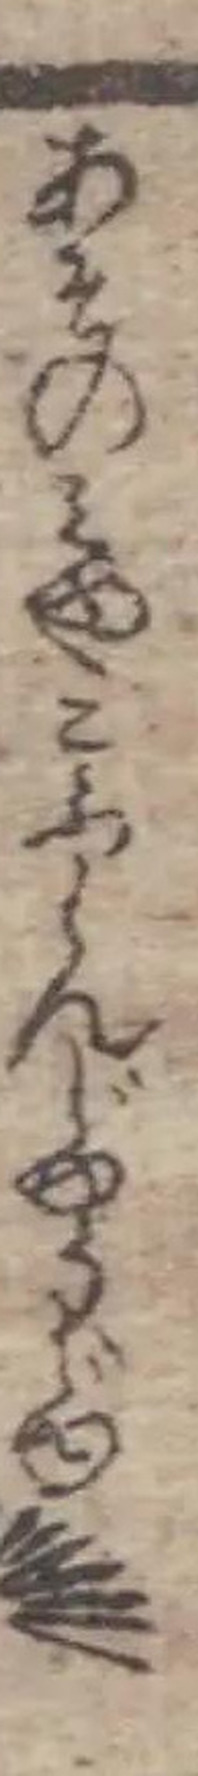あそのミやこふしんじやうじゆ
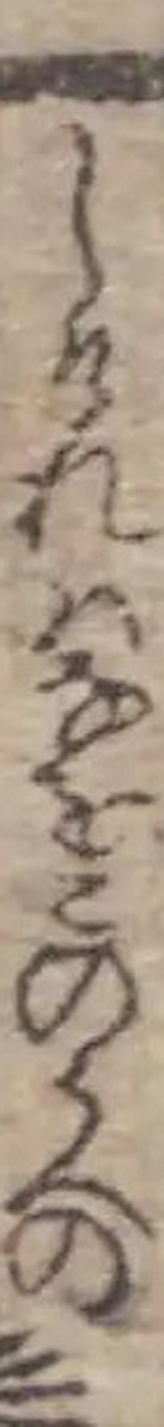しけれハなをこのうへの
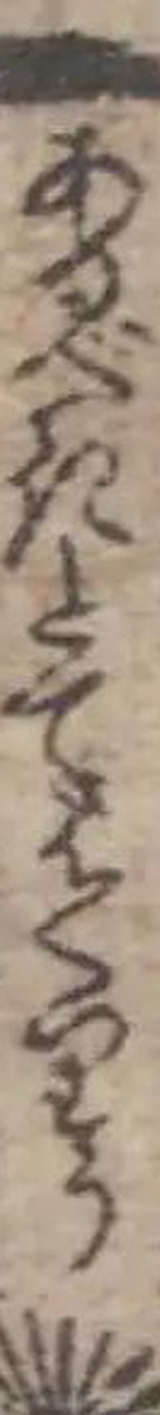あるべきとてはくりう
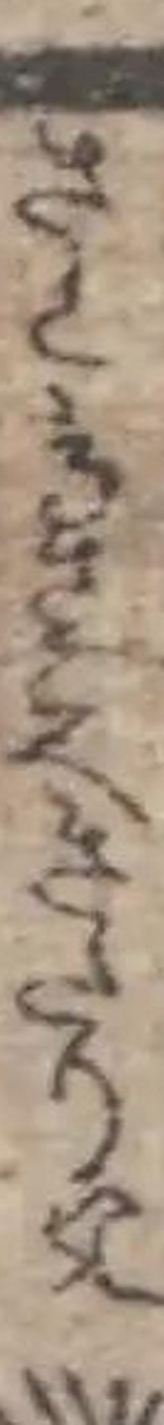さと高さこへきたり父
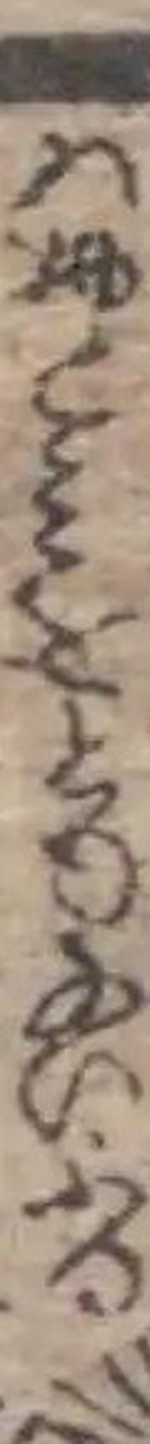ハおとミをともないふる
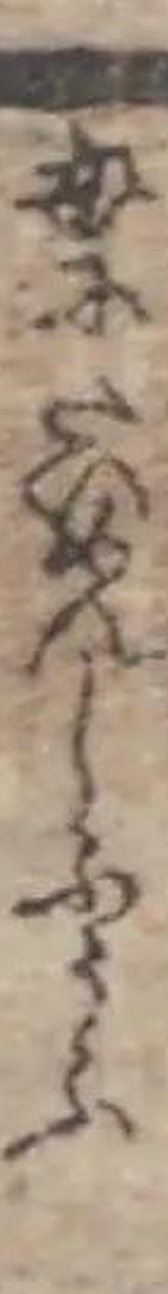母にたいめんしふうふ
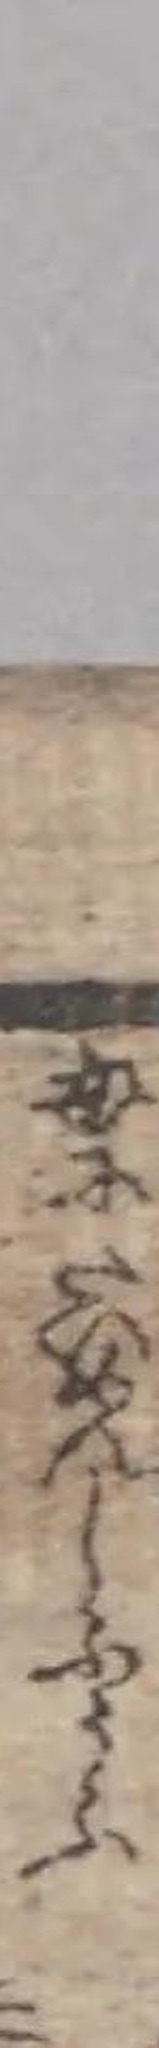母にたいめんしふうふ
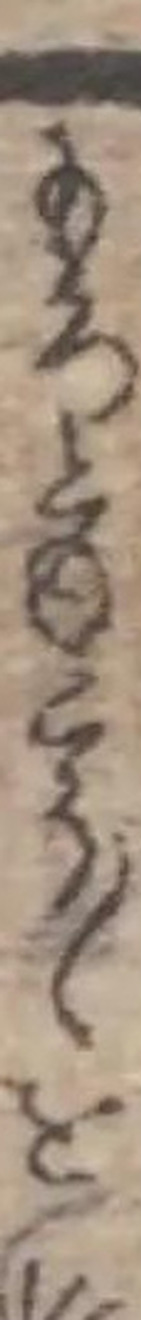もろともこう〳〵を
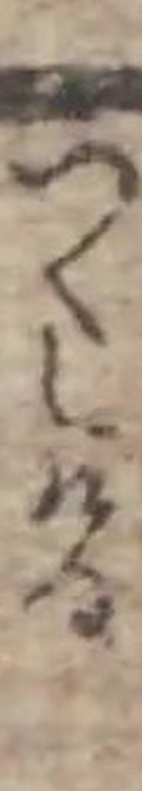つくしける
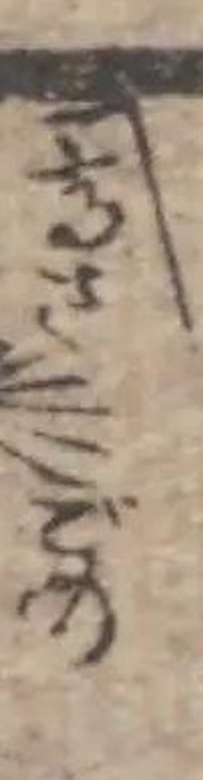「高さごの
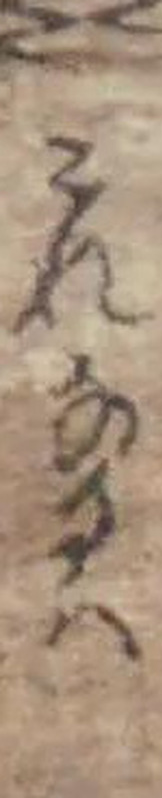これなるハ
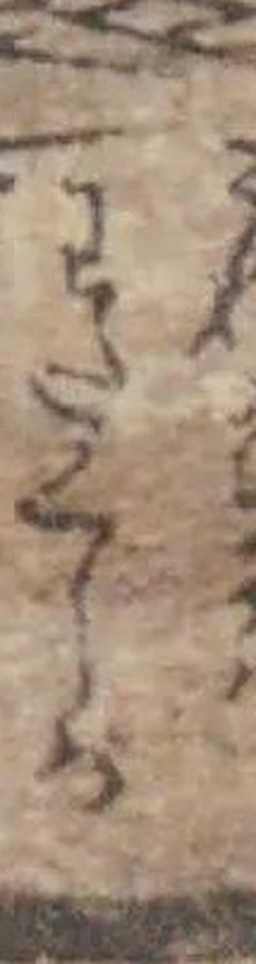わたくしが
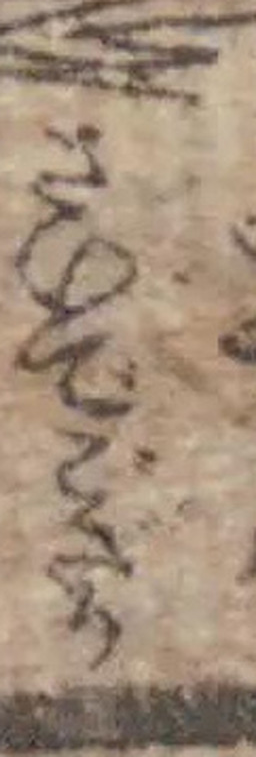さいでござり
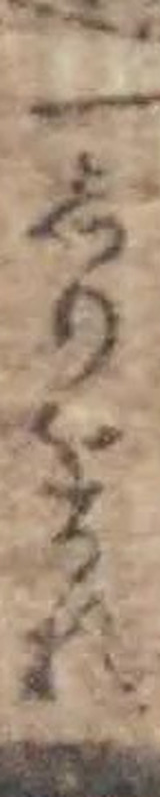しりをかれ
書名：草紙の曙 3巻
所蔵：国立国会図書館 National Diet Library, JAPAN
